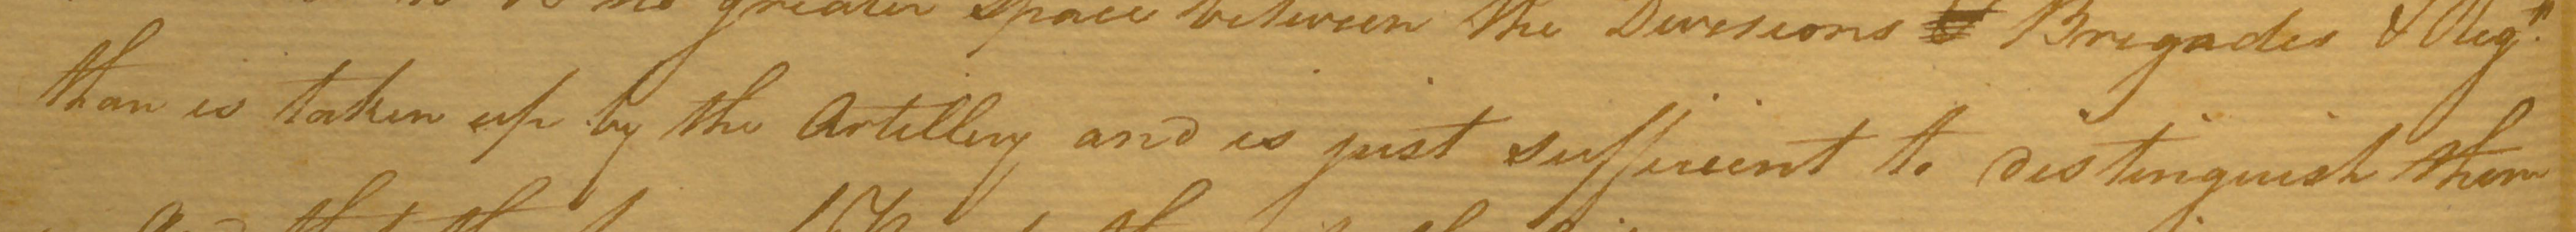than is taken up by the Artillery and is just sufficient to distinguish them
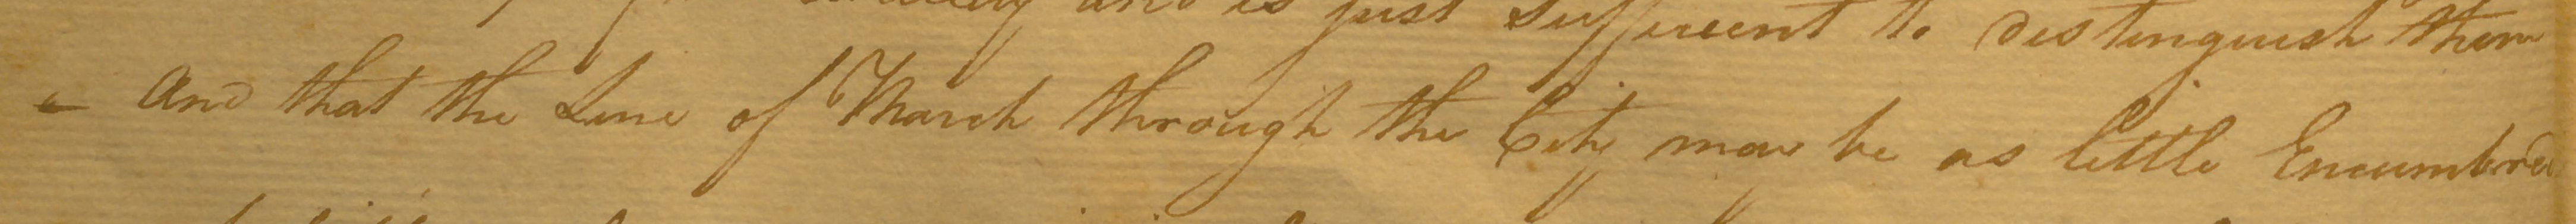-And that the Line of March through the City may be as little Encumbred
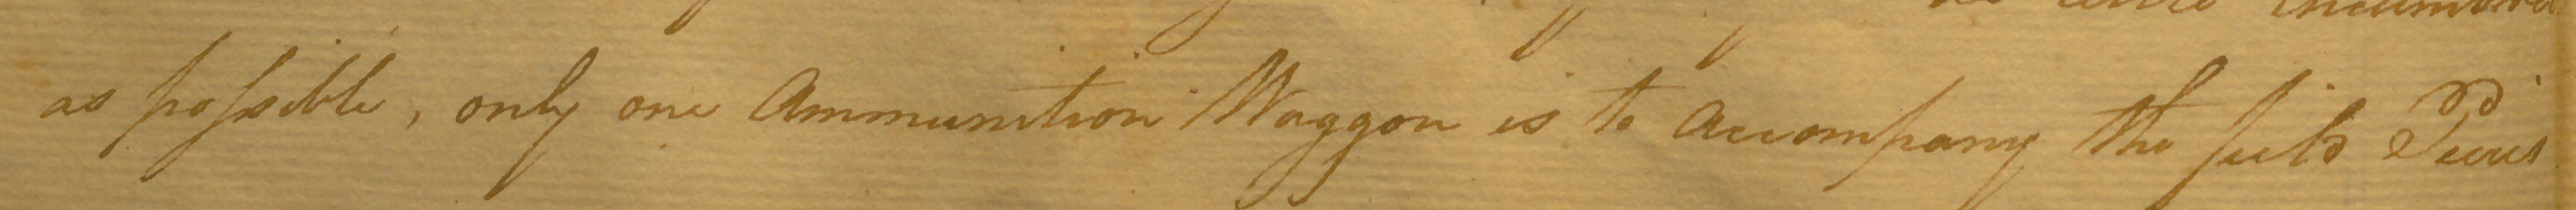as possible, only one Ammunition Waggon is to accompany the field Pieces
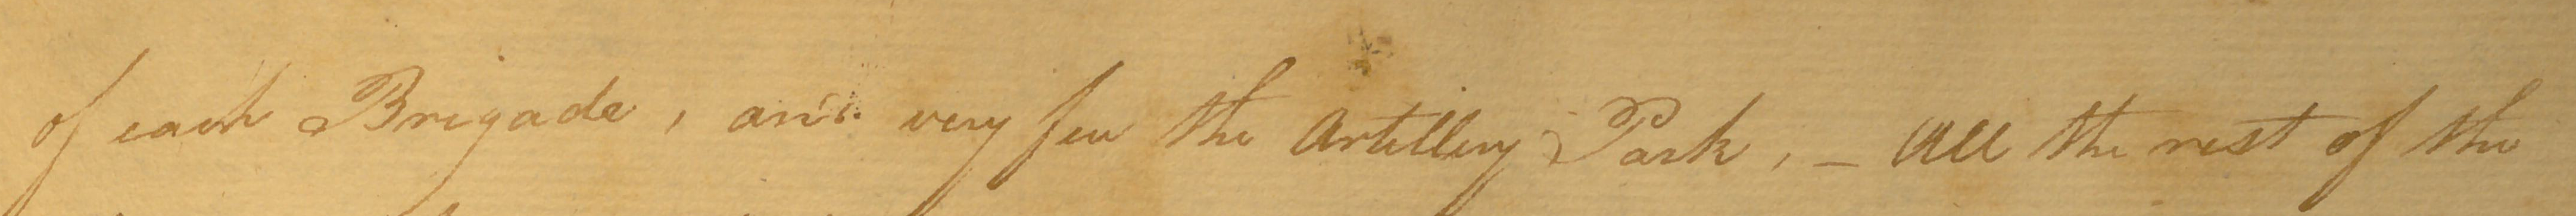of each Brigade, and very few the Artillery Park,- All the rest of the
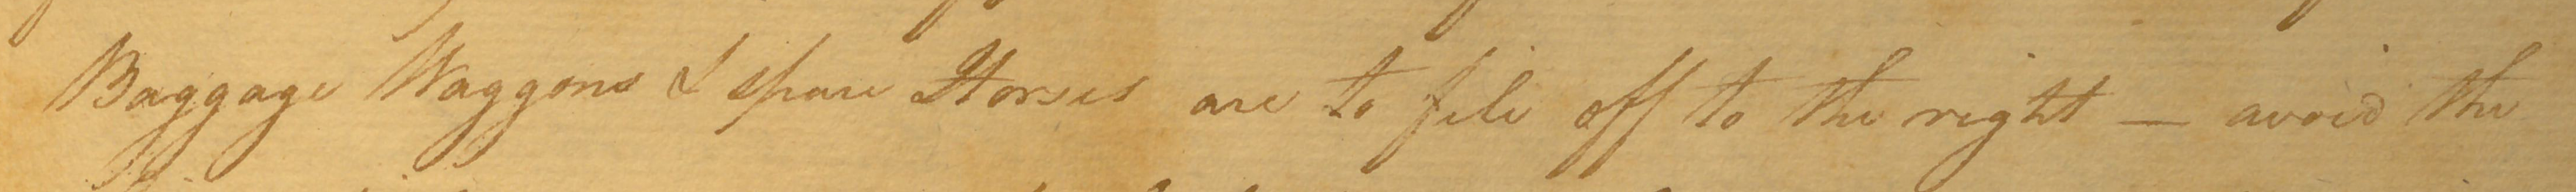Baggage Waggons & spare Horses are to file off to the right- avoid the
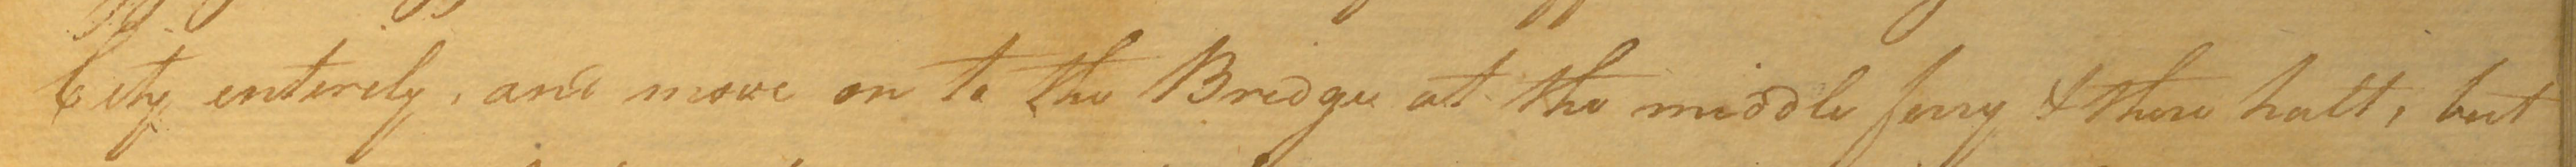City entirely, and move on to the Bridge at the middle ferry & there halt, but
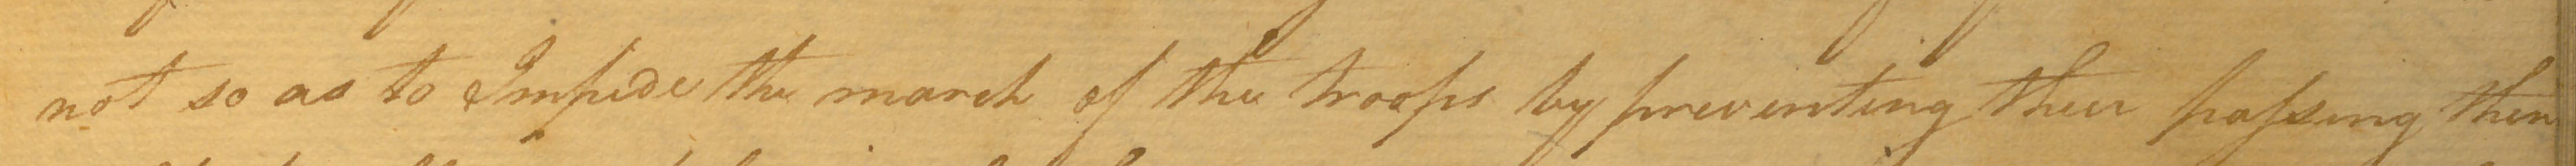not so as to Impede the march of the troops by preventing their passing them
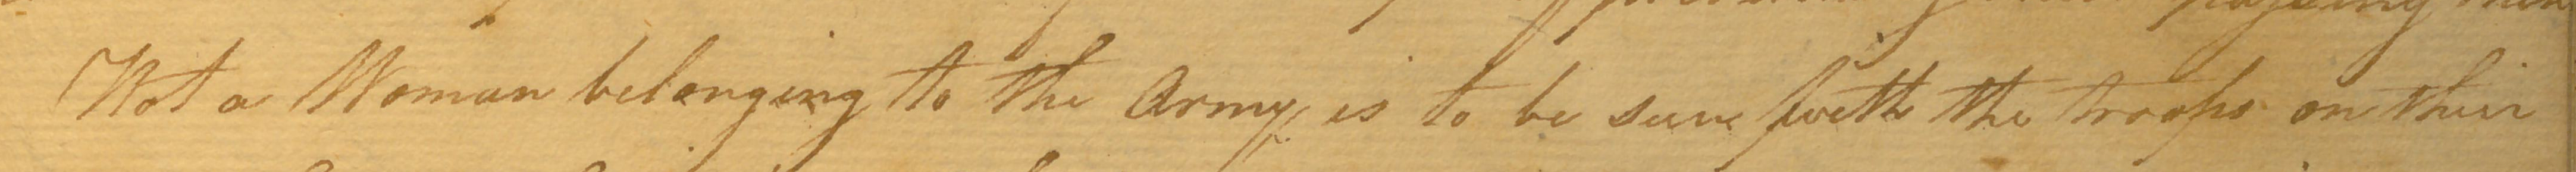Not a Woman belonging to the Army is to be saw with the troops on their
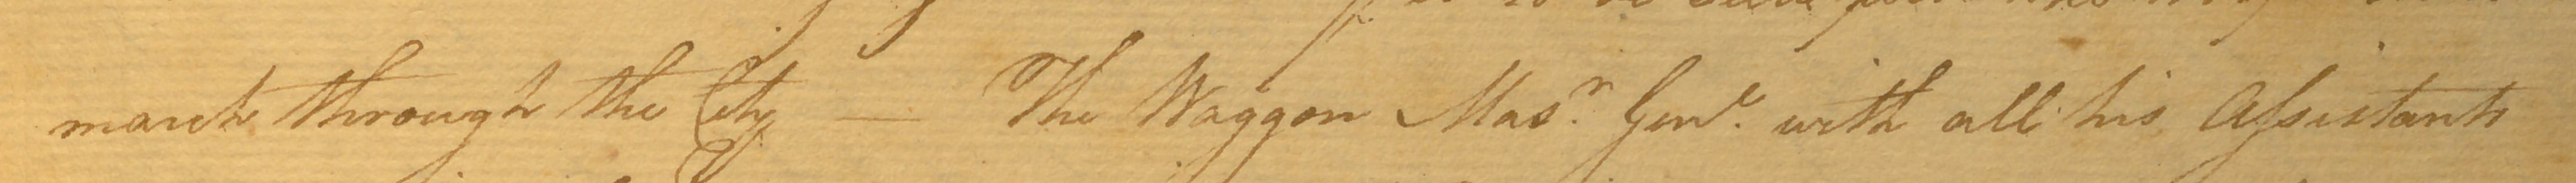march through the City- The Waggon Mas^r. Gen^l. with all his Assistants
